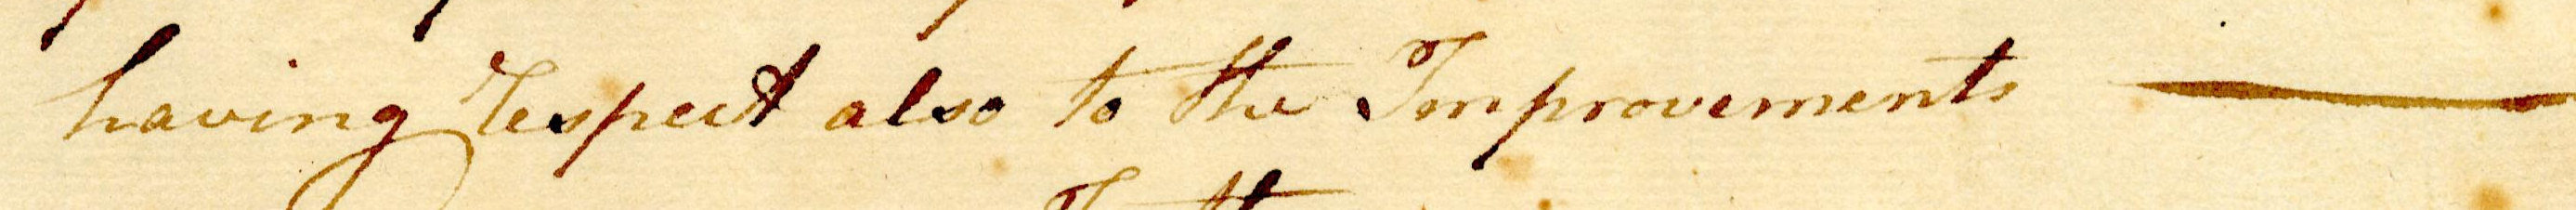having respect also to the Improvements-
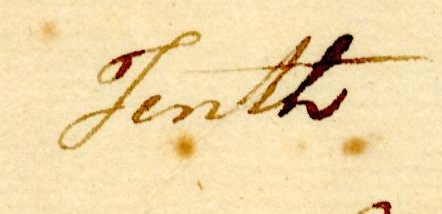Tenth
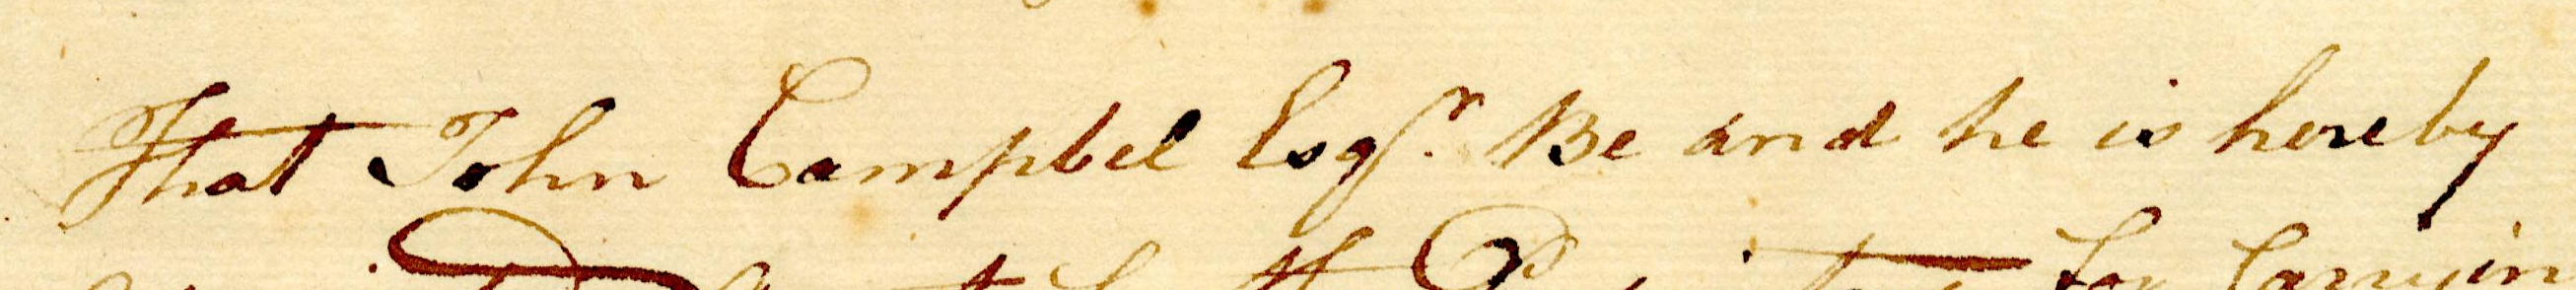That John Campbel Esq^r. Be and he is hereby
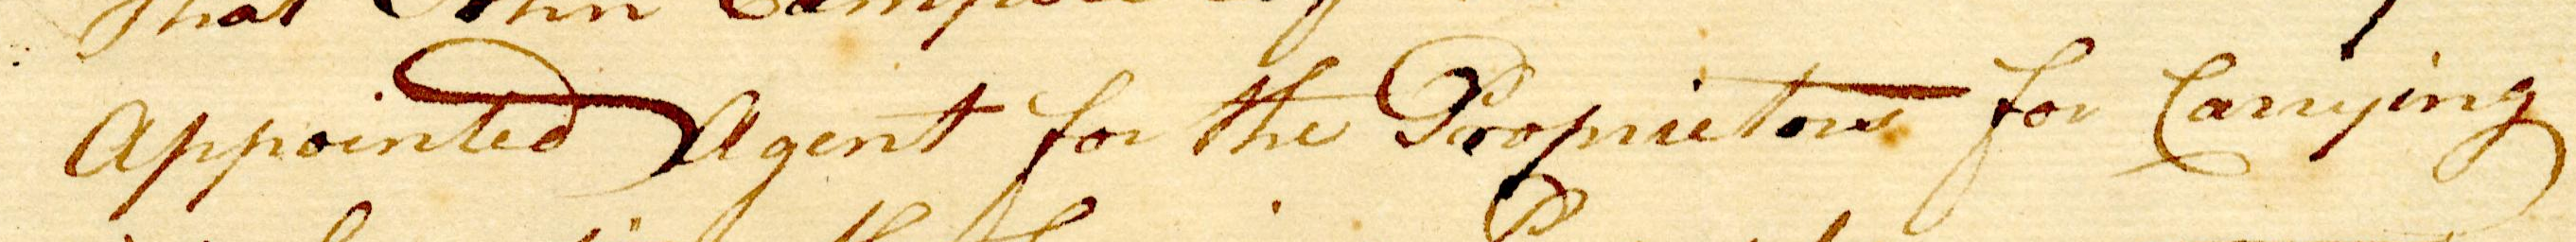Appointed Agent for the Proprietor for Carrying
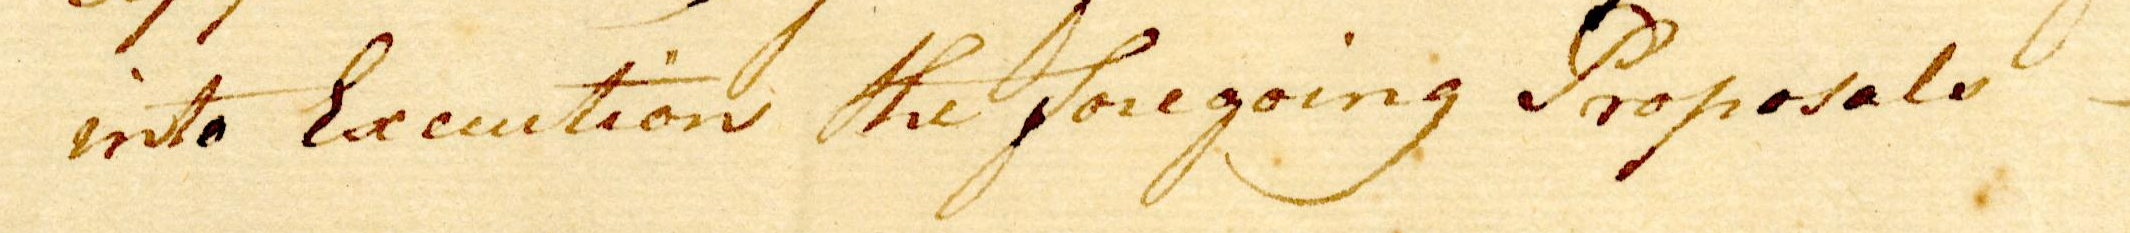into Execution the foregoing Proposals
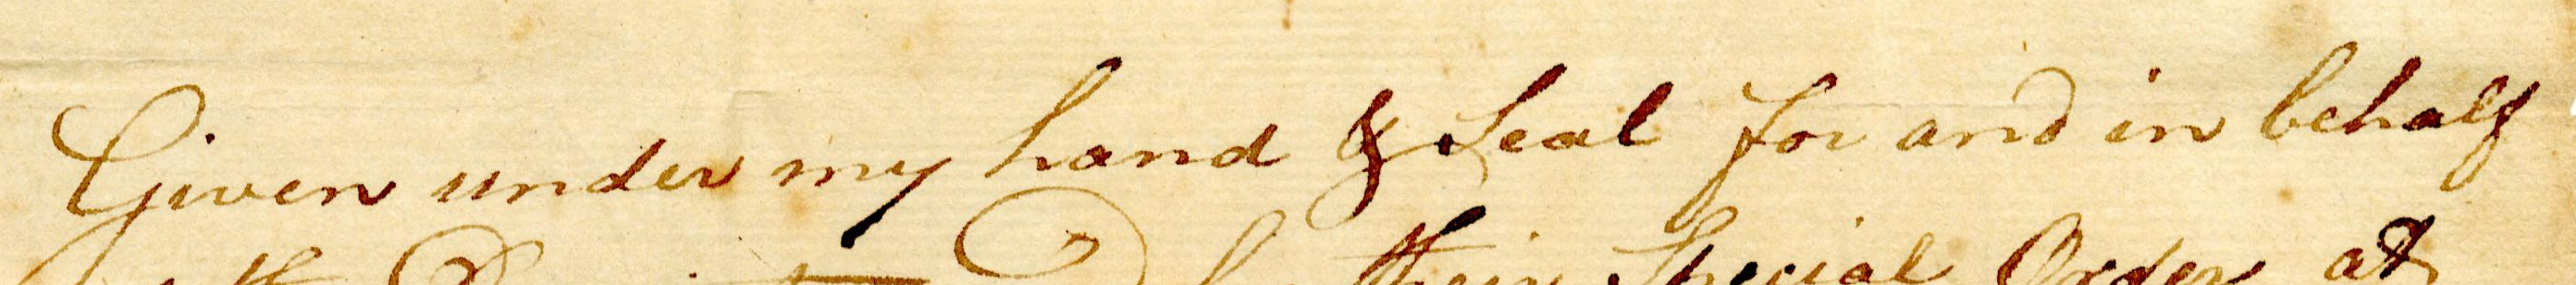Given under my hand & seal for and in behalf
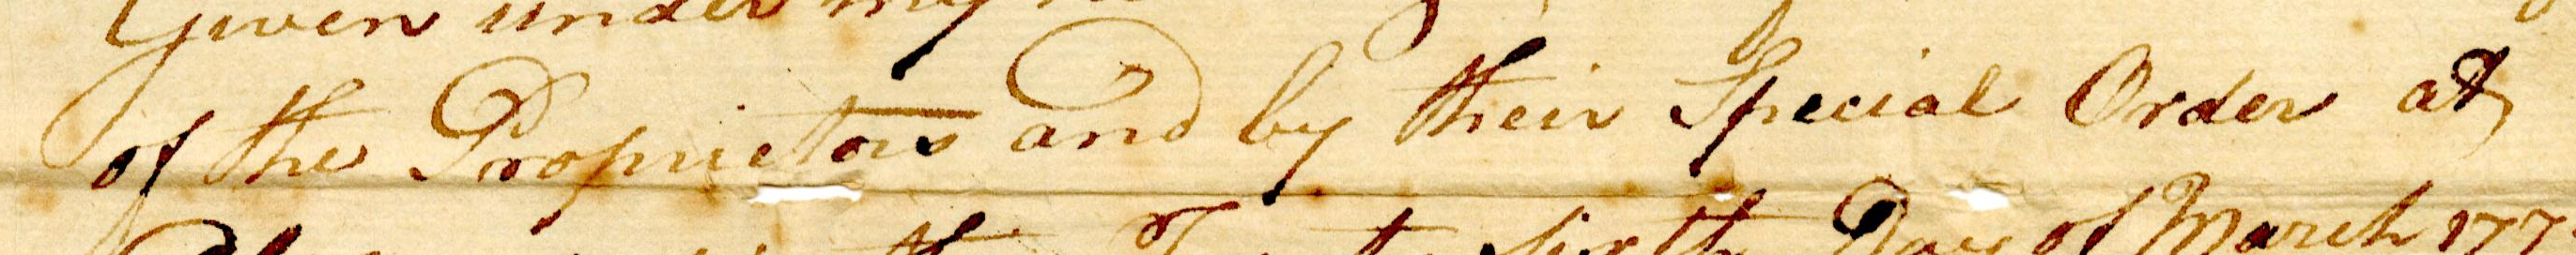of the Proprietors and by their Special Order at,
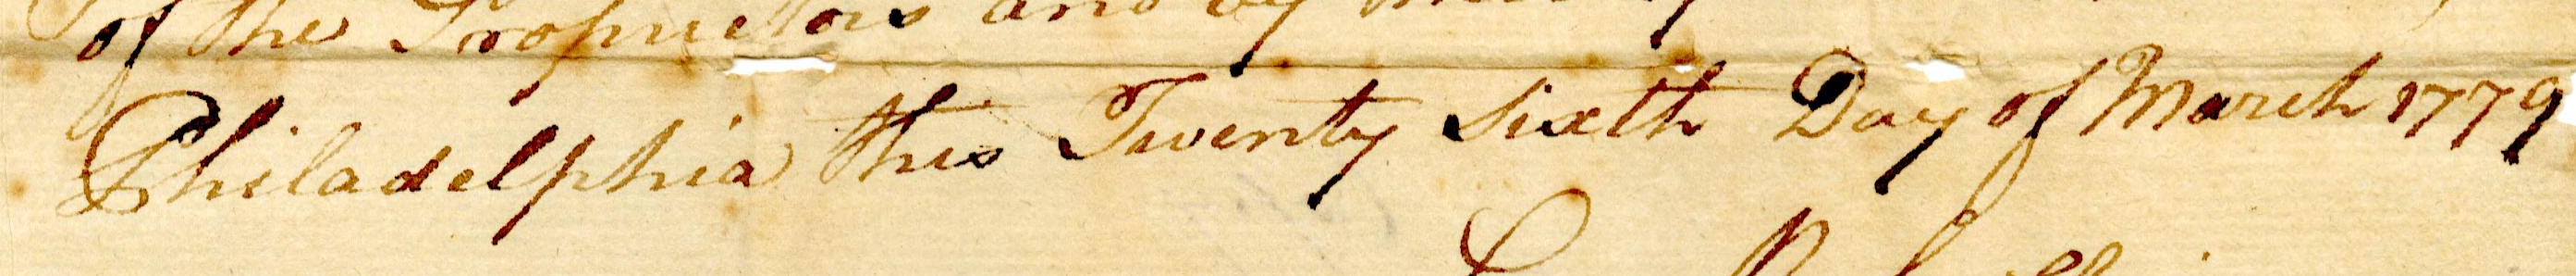Philadelphia this Twenty Sixth Day of March 1779
